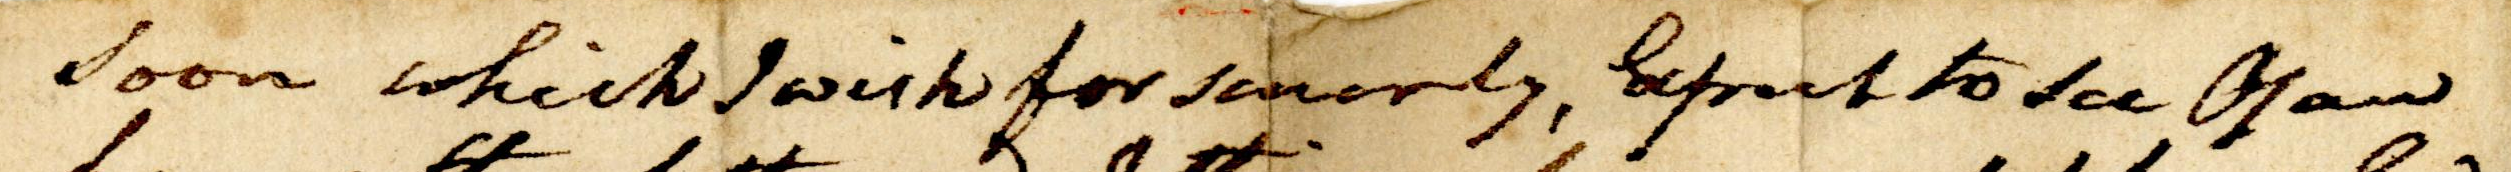soon which I wish for severly. Expect to see you
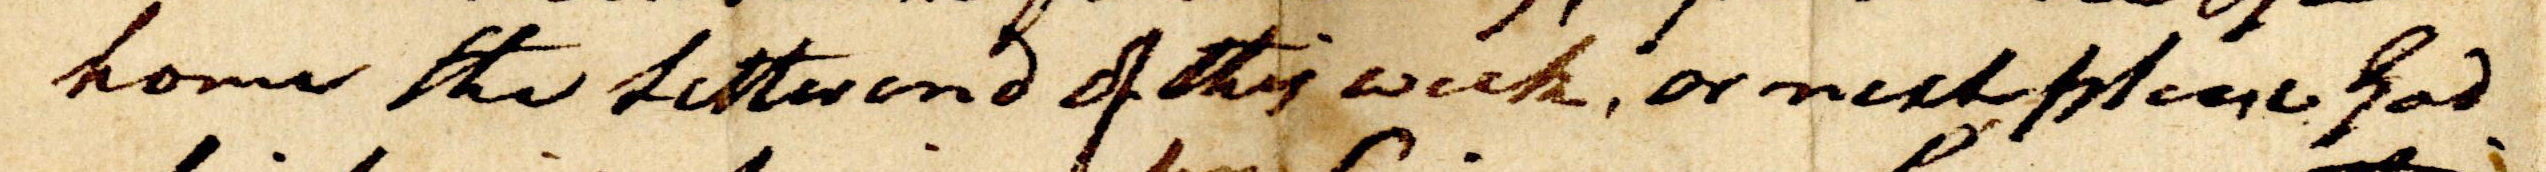home the Letter and of this week, or next please God
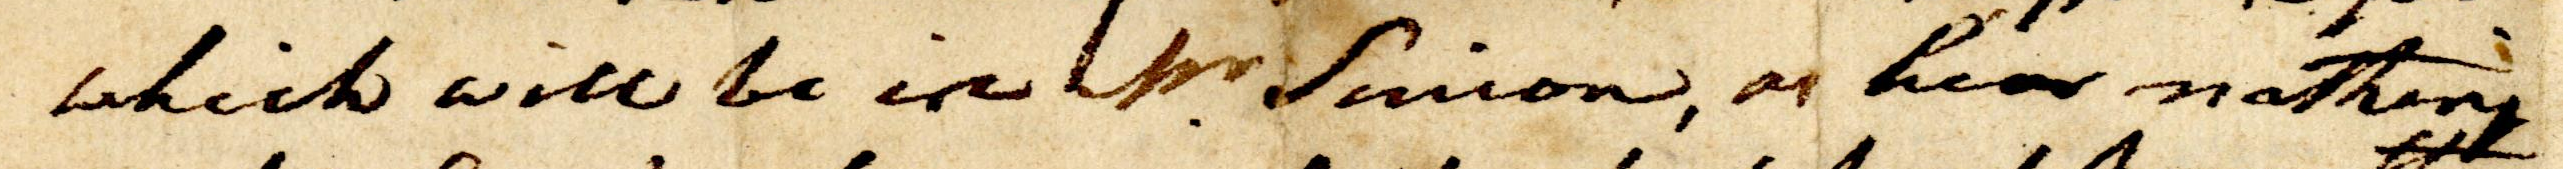which will be in M^r Simon, of hear nothing
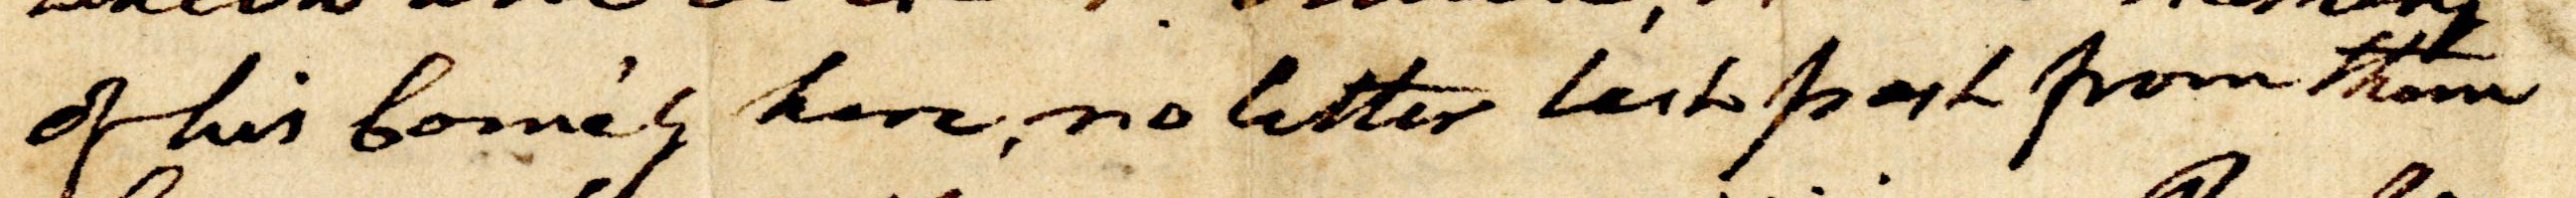of his Come'g here, no letter last post from them
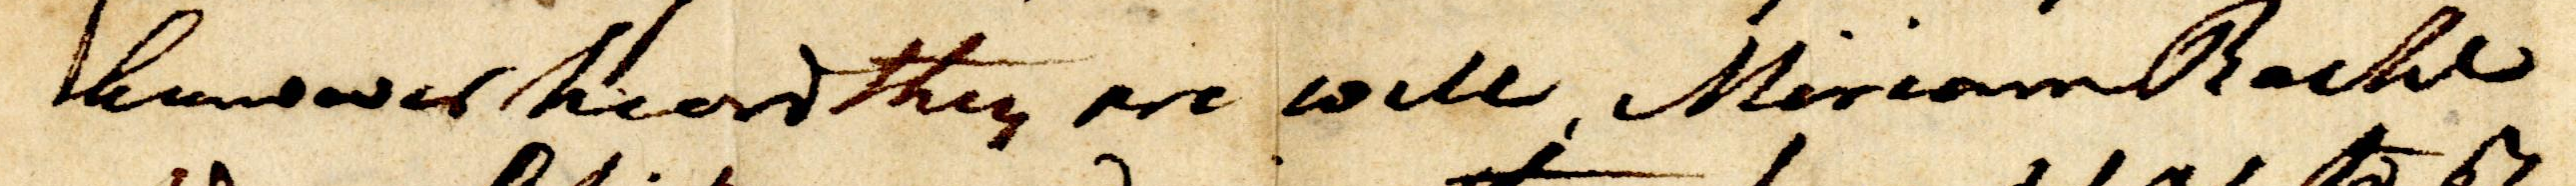however heard they are well, Miriam Rachl
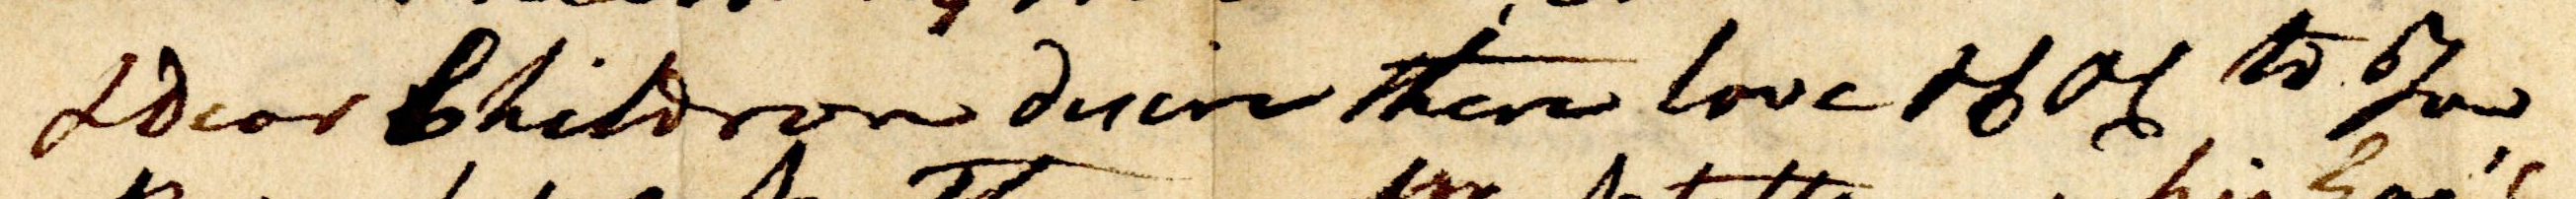& dear Children desire there love &c &c to you
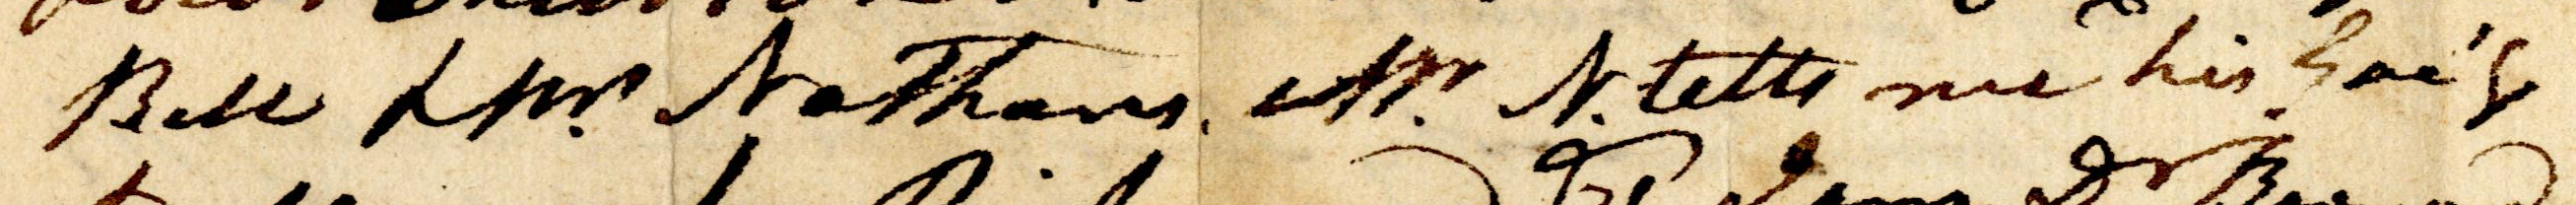Bell & M^r Nathans M^r. N. tells me his goe'g
